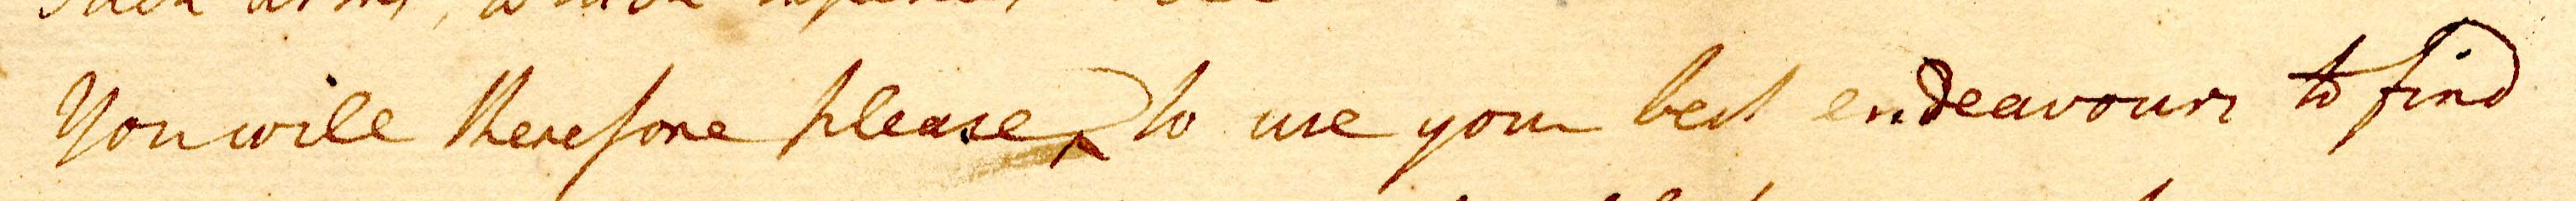You will therefore please to use you best endeavours to find
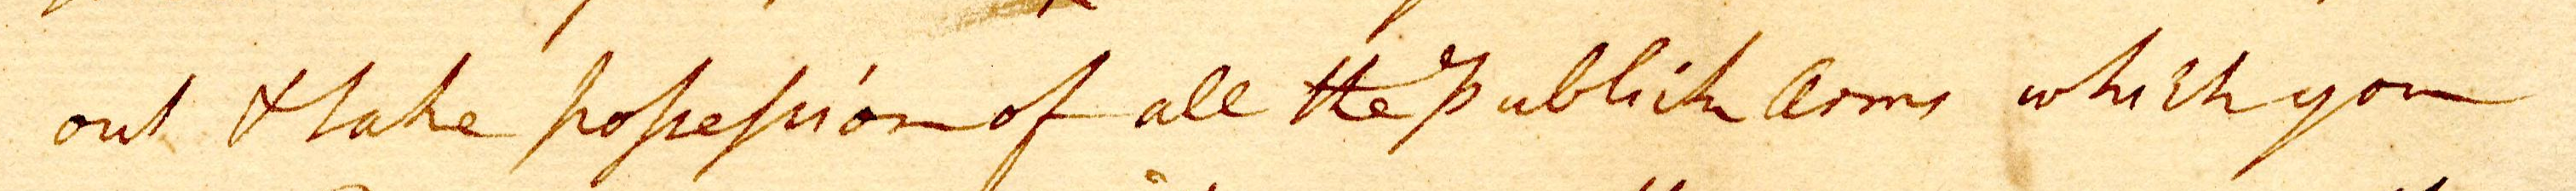out & take possessson of all the publick Arms which you
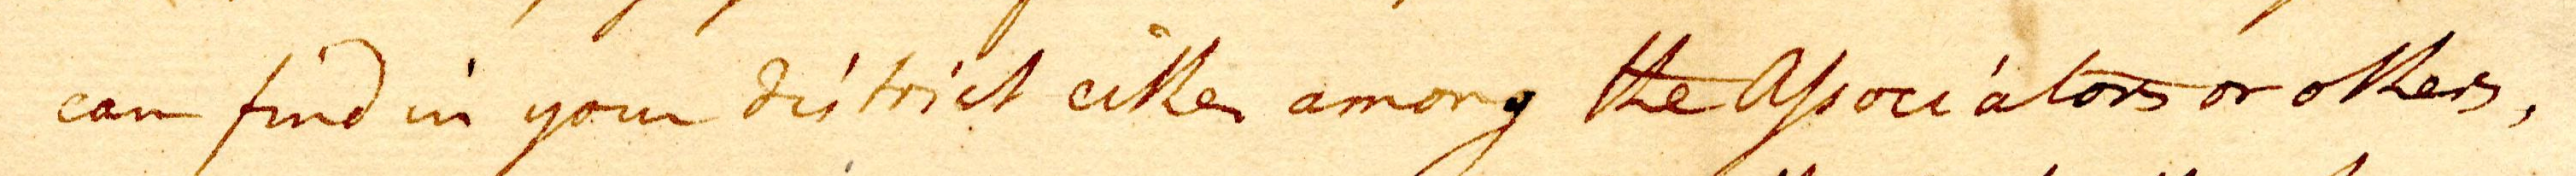can find in your district either among the Associators or others,
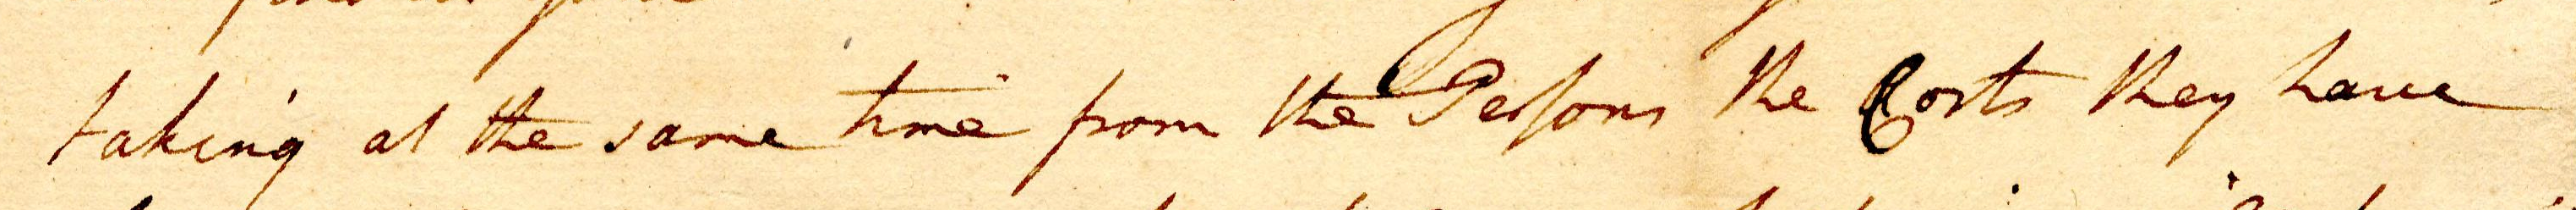taking at the same time from the Persons the Costs they have
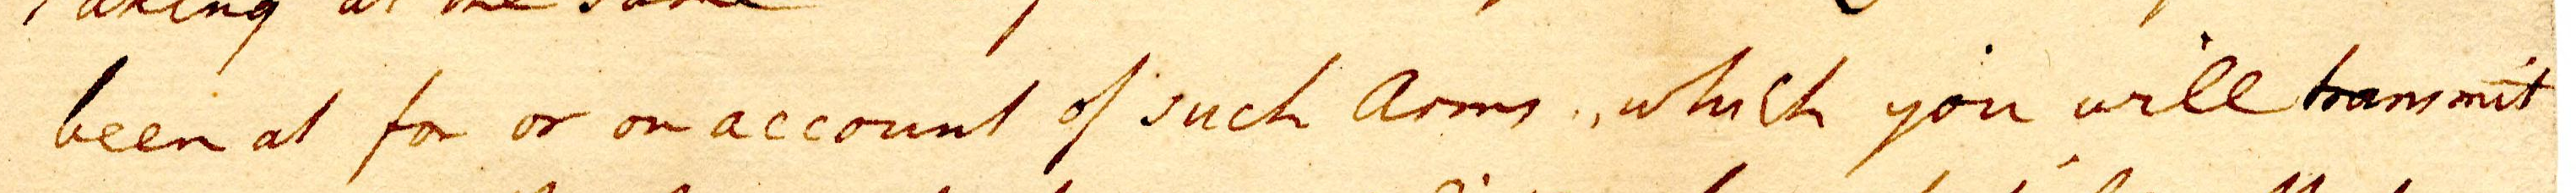been at for or on account of such Arms, which you will transmit
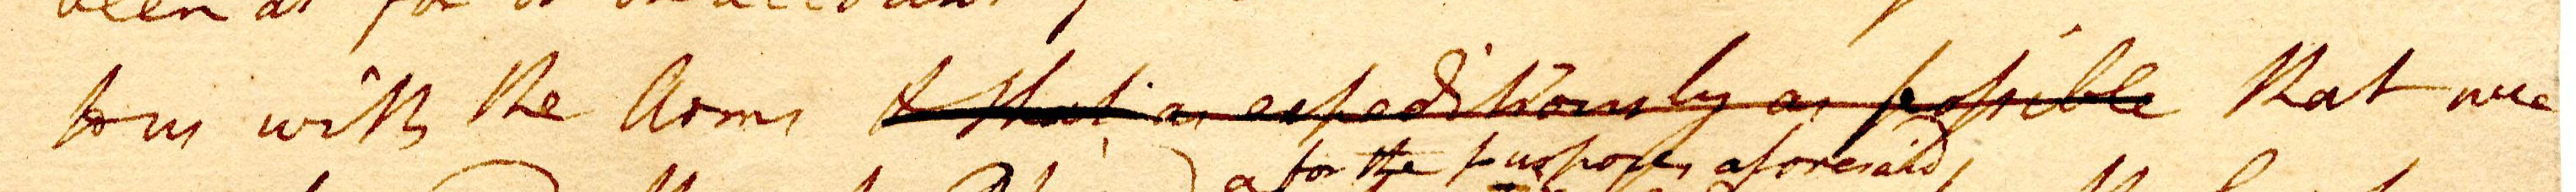to us with the Arms & that as expeditiously as possible that we
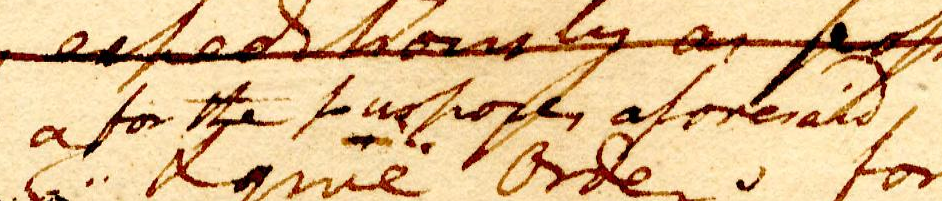for the purposes aforesaid
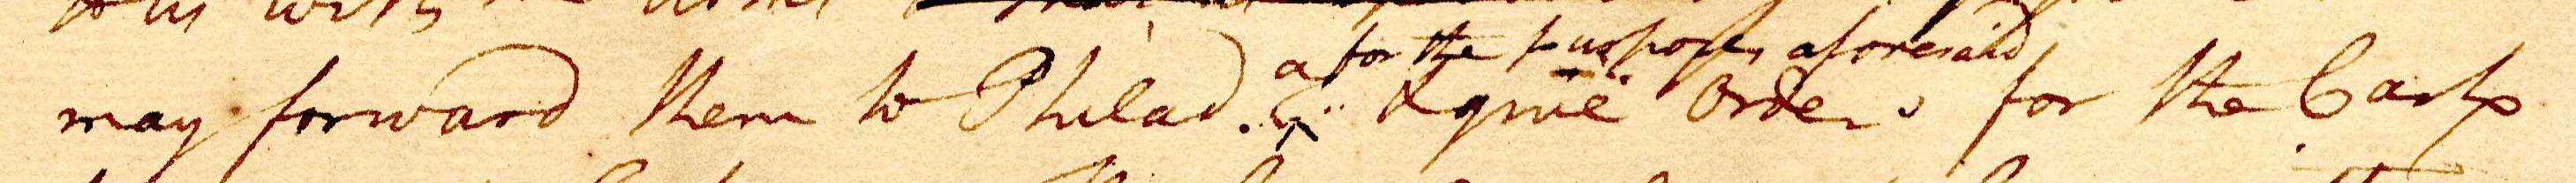may forward them to Philad^a. ^ & give orders for the Capt
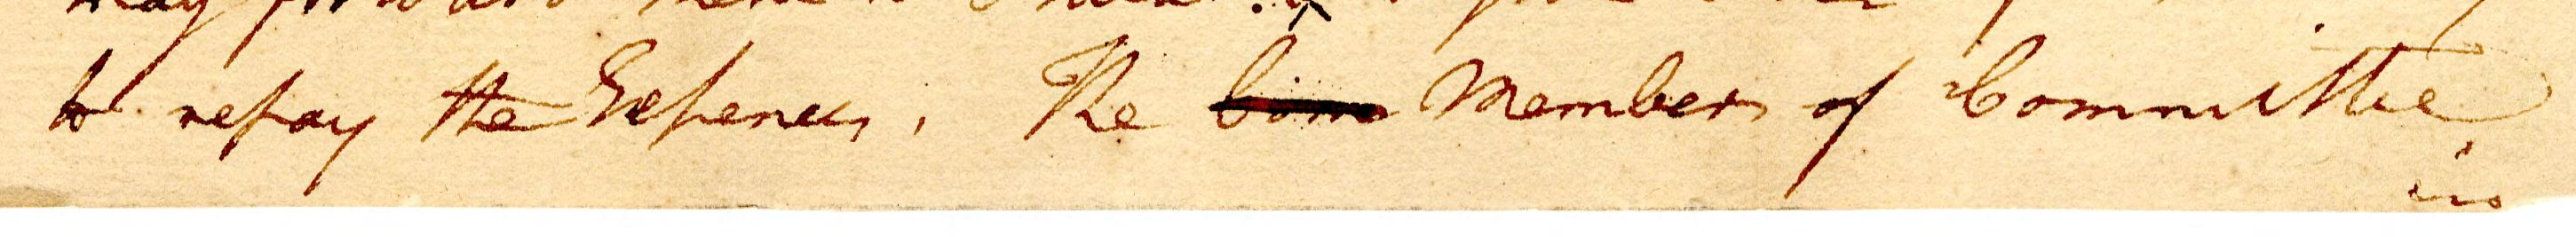to repay the Expences. The [___] Member of Committee
